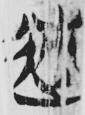述（遂）
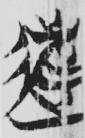逃
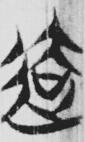迲（去）
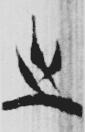之（至）
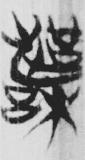桑（蒼）
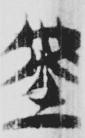○（梧）
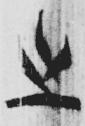之
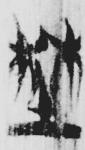埜（野）
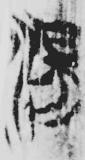湯
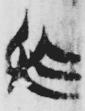於
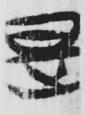是
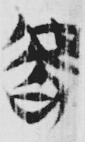唬（乎）
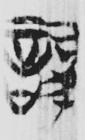○（徵）
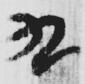九
